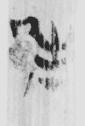邦
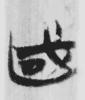或
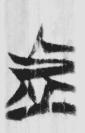者
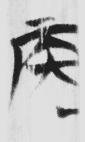侯
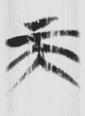天
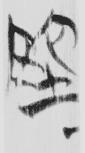地
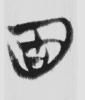固
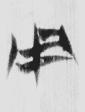用
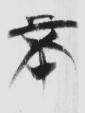不
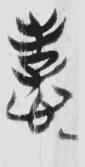悖
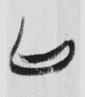㠯（以）
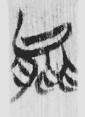能
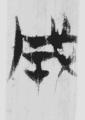成
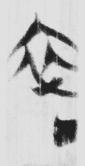卒
